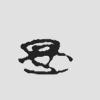是
